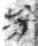芳
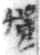糧
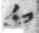㠯
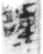量
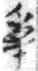犢
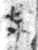某
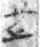武
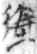○（夷）
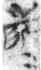之所
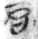君
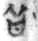昔
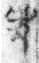受
